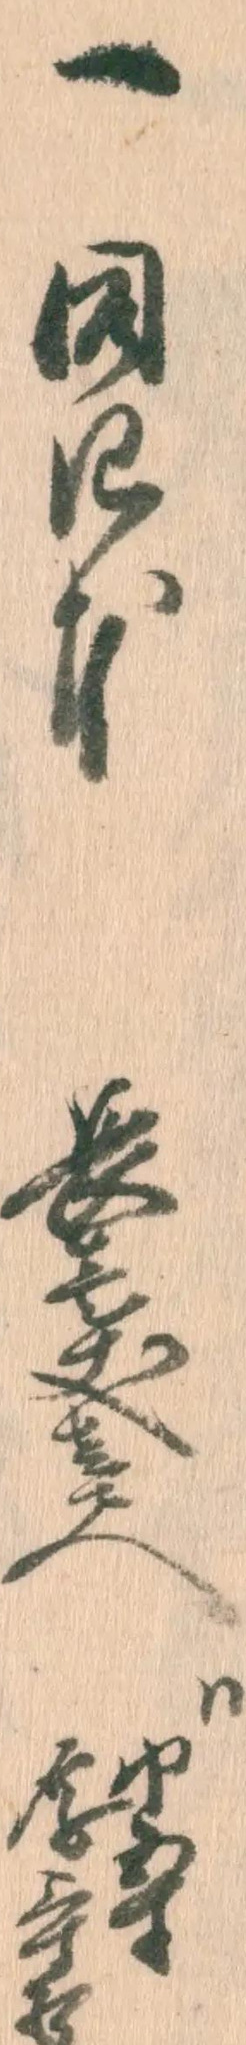一栂壱本長壱丈壱尺巾四寸
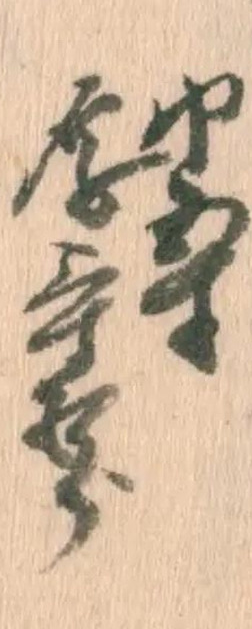厚四寸五分
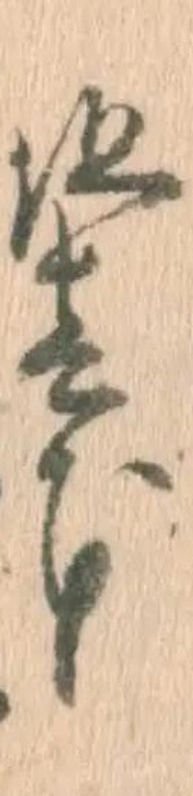但壱本
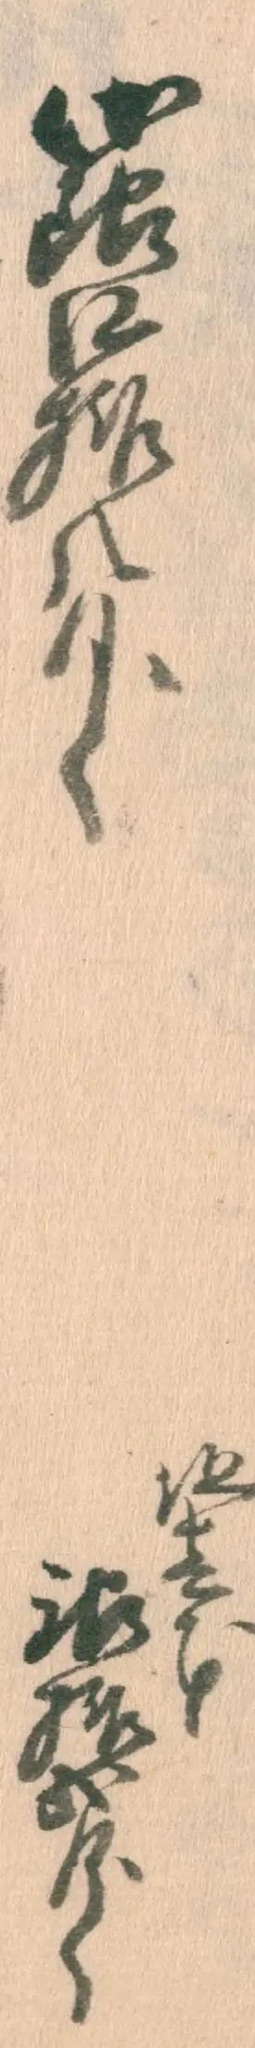代銀四拾八匁銀拾弐匁
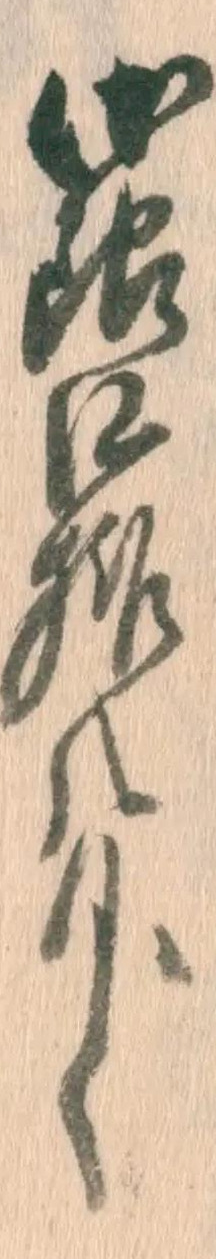代銀拾三匁
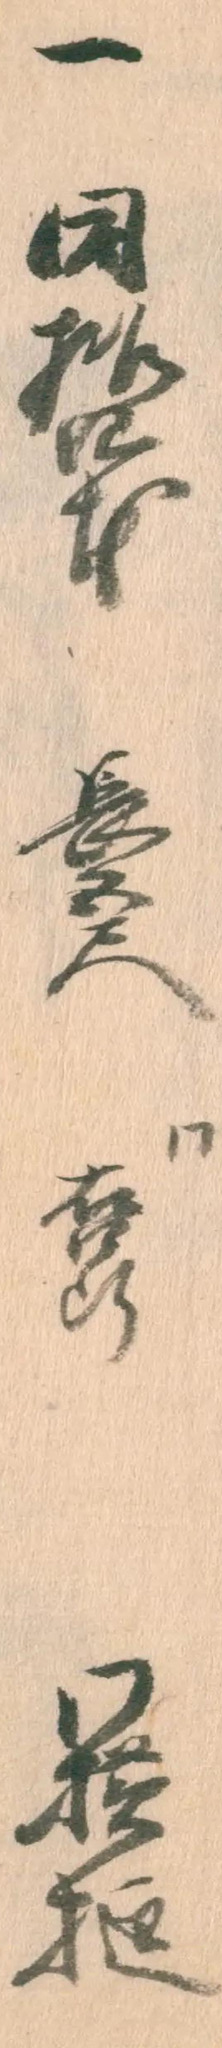一同拾四本長五尺同右同断同横框
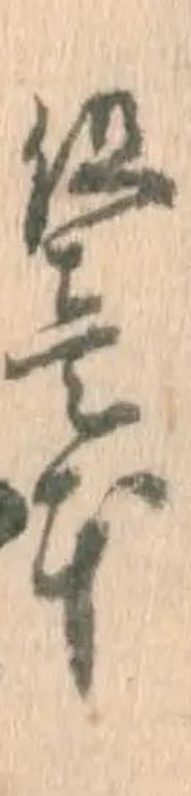但壱本
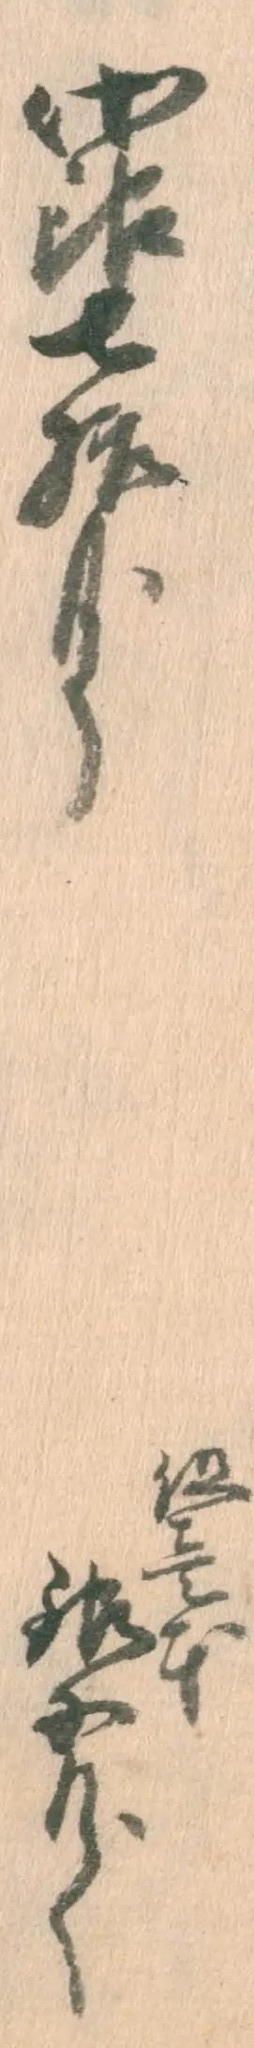代銀七拾匁銀五匁

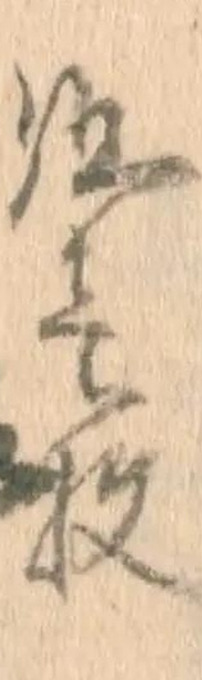但壱枚
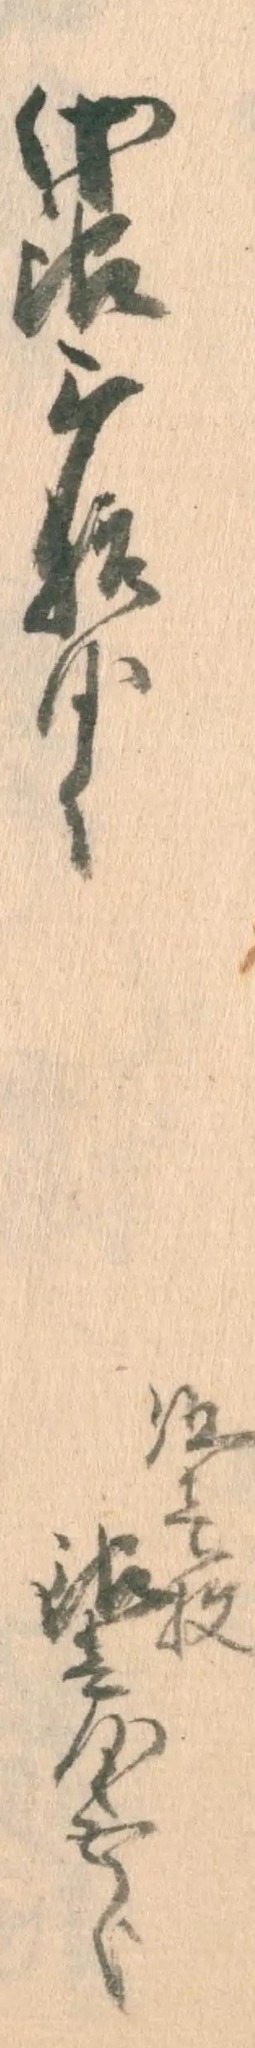代銀三拾匁銀壱匁五分
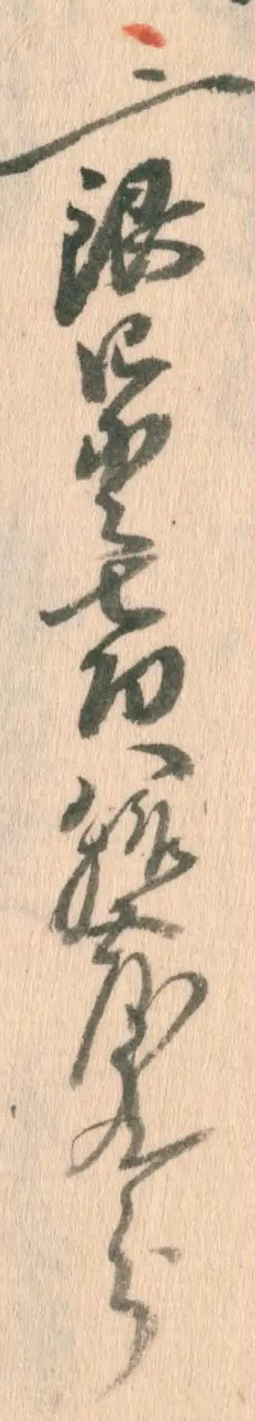一銀四貫七百八拾五匁九分
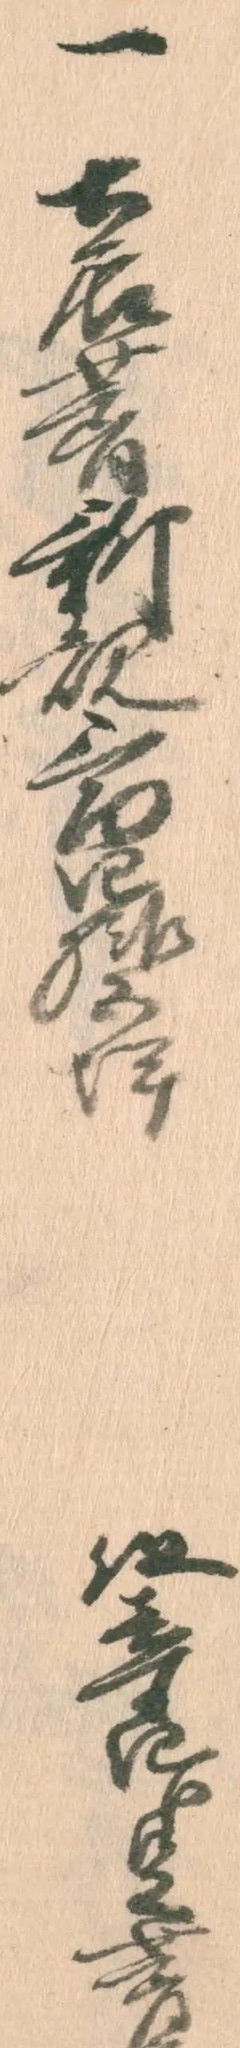一土居萱新規三百四拾五坪但壱寸四分足萱立
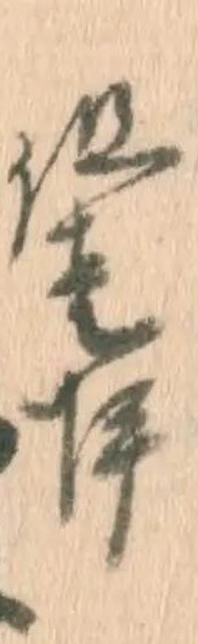但壱坪
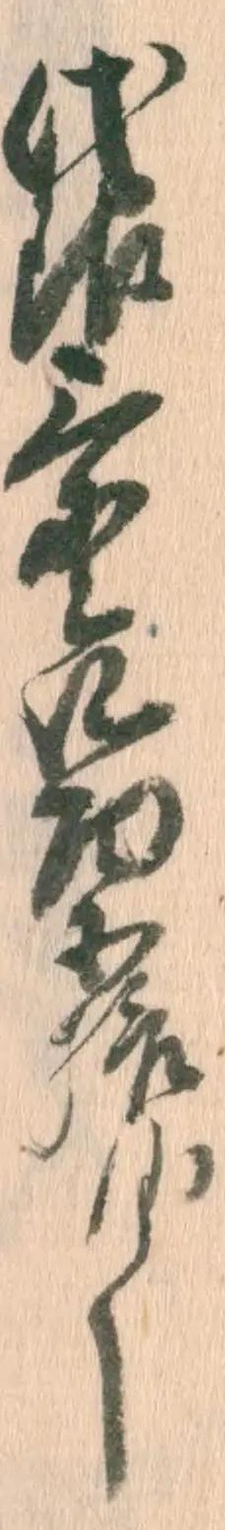代銀三貫四百五拾匁銀拾匁
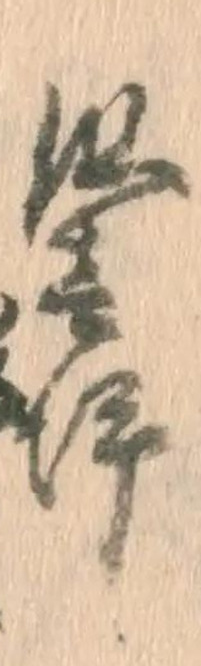但壱坪
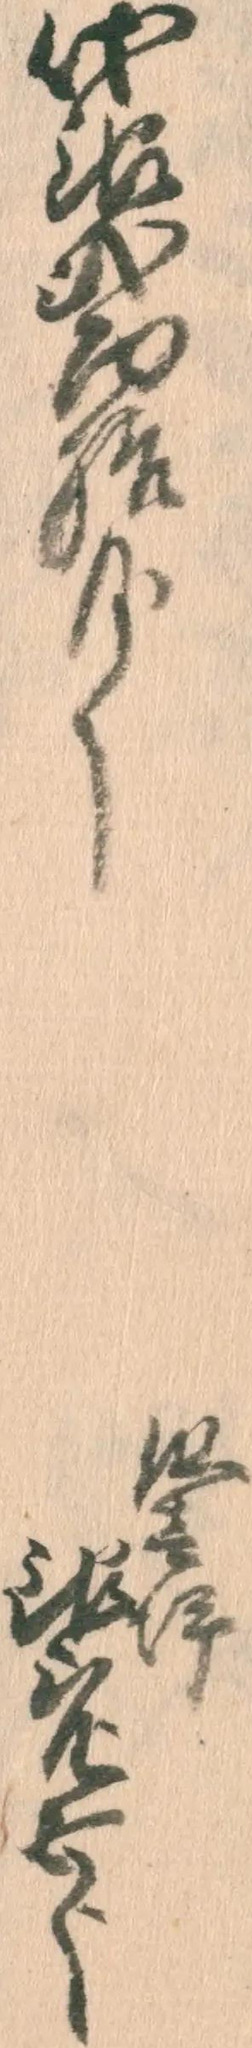代銀弐百拾匁銀三匁五分
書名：三十三間堂. [1]
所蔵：国立国会図書館 National Diet Library, JAPAN
